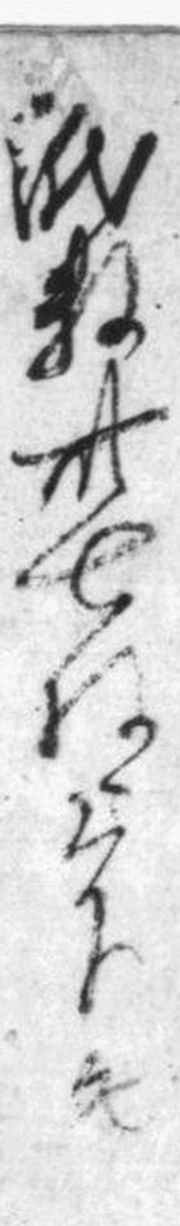紙数卅七枚上トモ
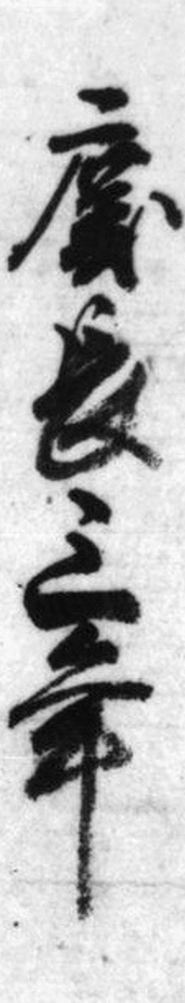慶長三年
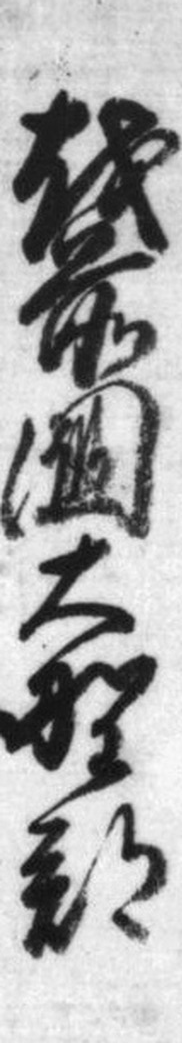越前国大野郡
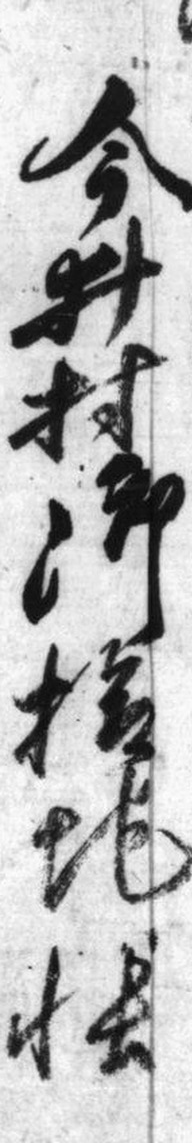今井村御検地帳
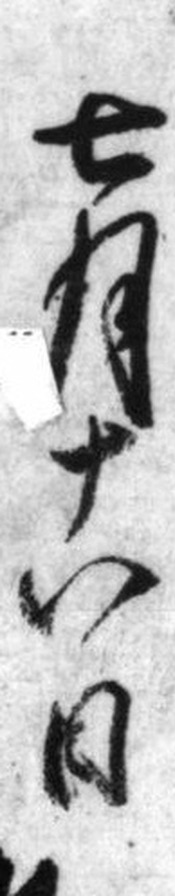七月十八日
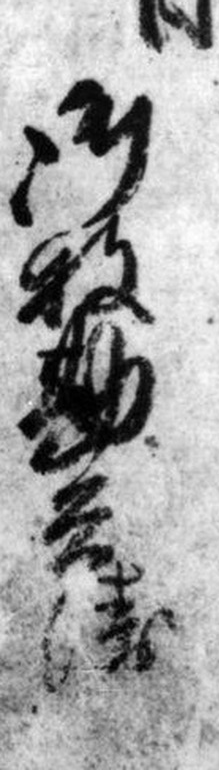御牧勘兵衛

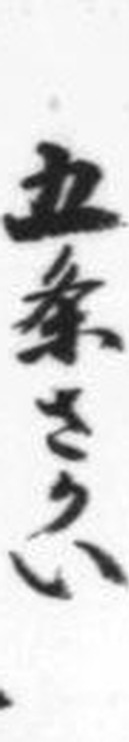五条さかい
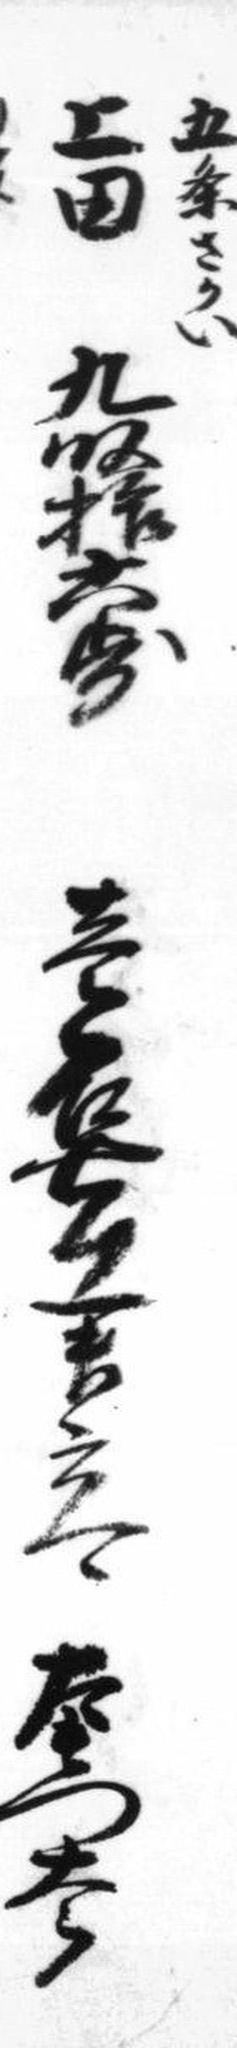上田九畝拾六歩壱石七斗一升六合左衛門太郎
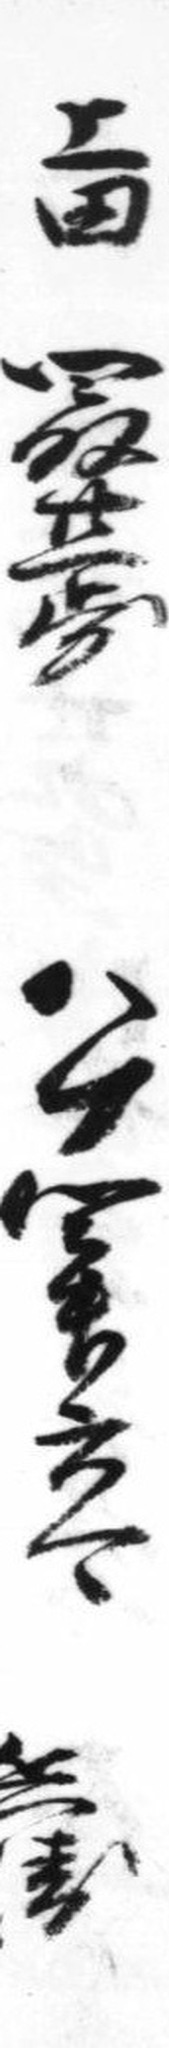上田四畝廿一歩八斗四升六合兵衛
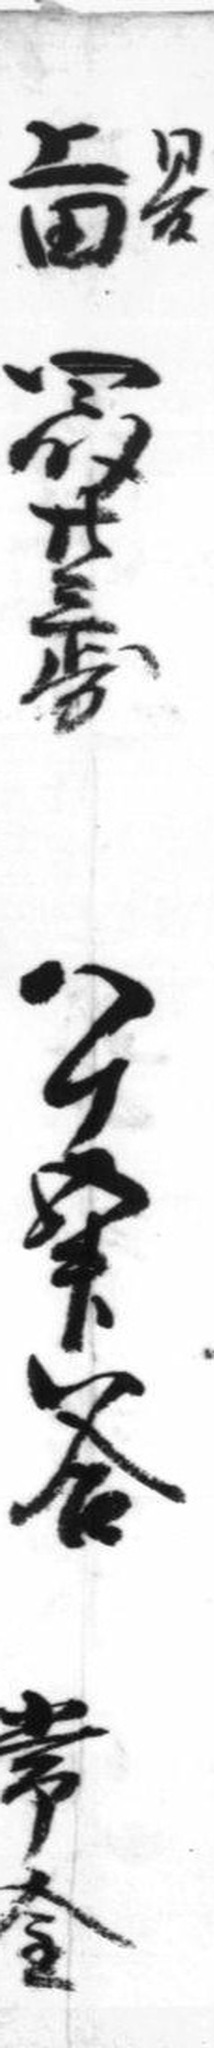上田四畝廿三歩八斗五升八合常念
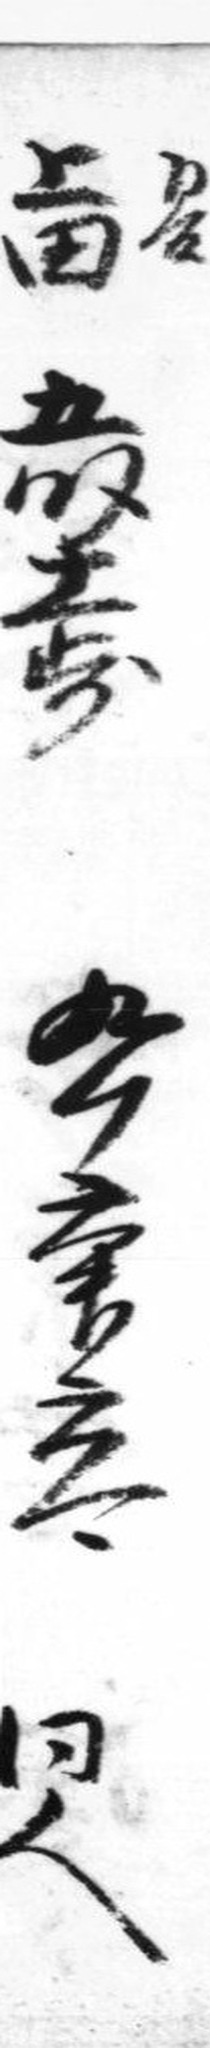上田五畝十一歩九斗六升六合同人

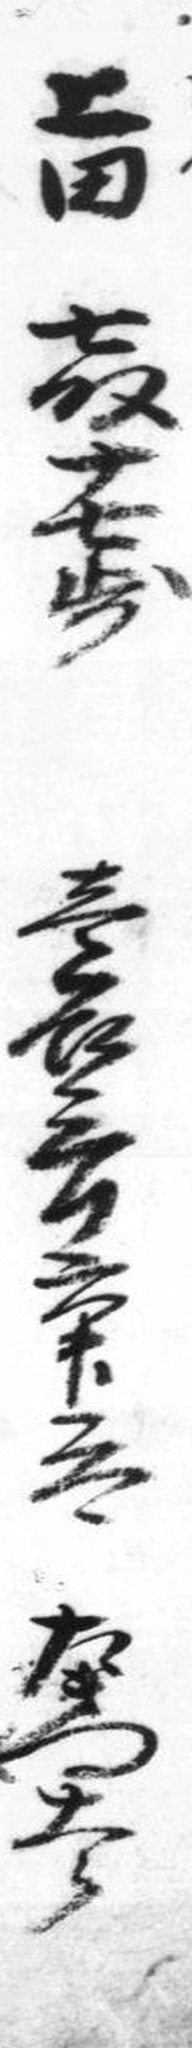上田七畝十七歩壱石三斗六升六合左衛門太郎
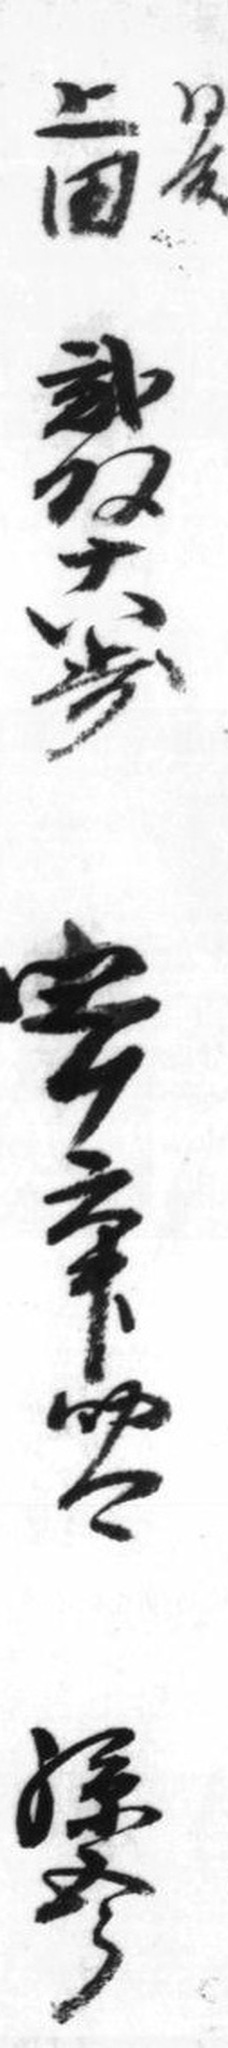上田弐畝十八歩五斗六升四合源五郎
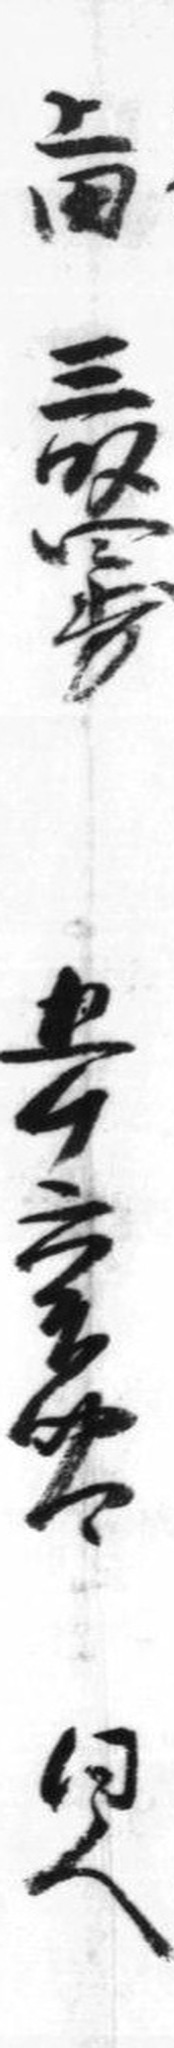上田三畝四歩五斗六升四合同人
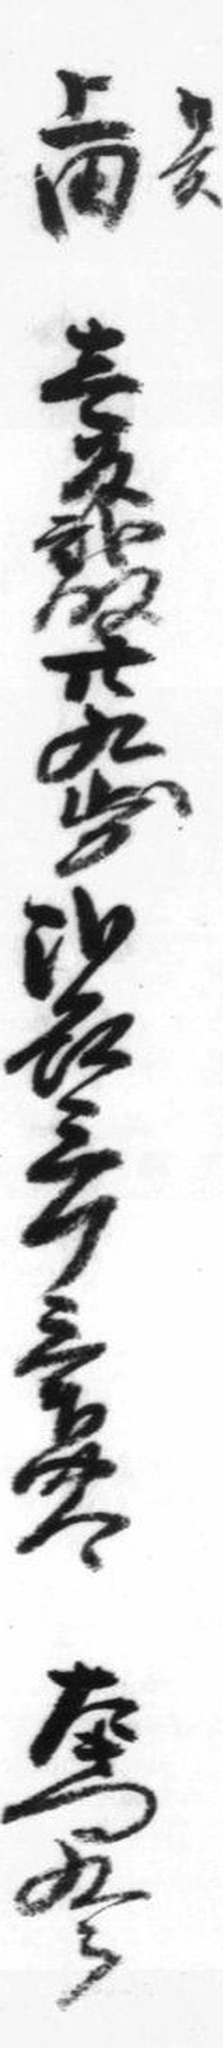上田壱反弐畝廿九歩弐石三斗三升四合左衛門九郎
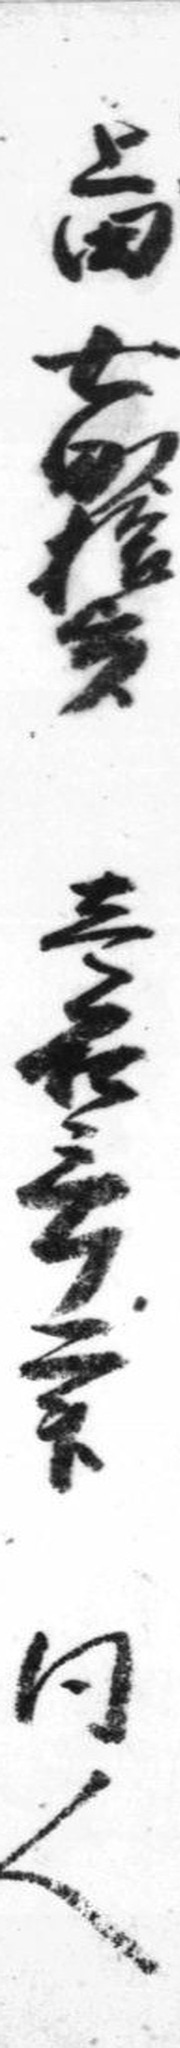上田七畝拾歩壱石三斗二升同人
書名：越前国大野郡今井村御検地帳
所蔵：福井県文書館 Fukui Prefectural Archives
